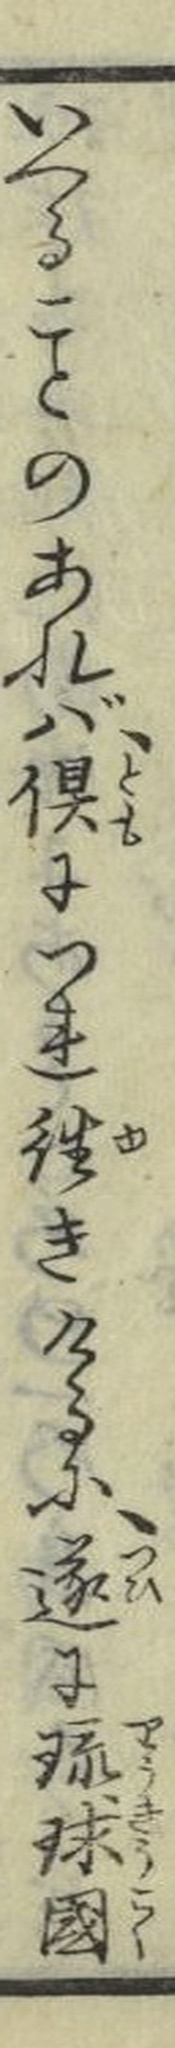いへることのあれば、倶につれ往きけるに、遂に琉球国
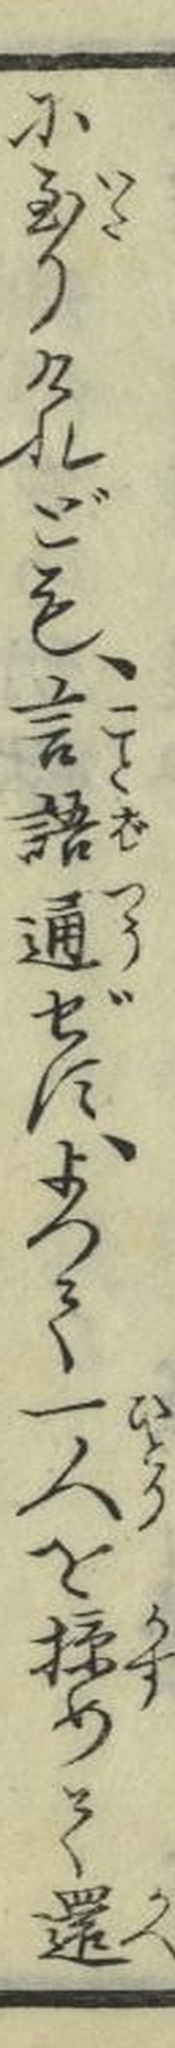に至りけれども、言語通ぜす、よつて一人を掠めて還
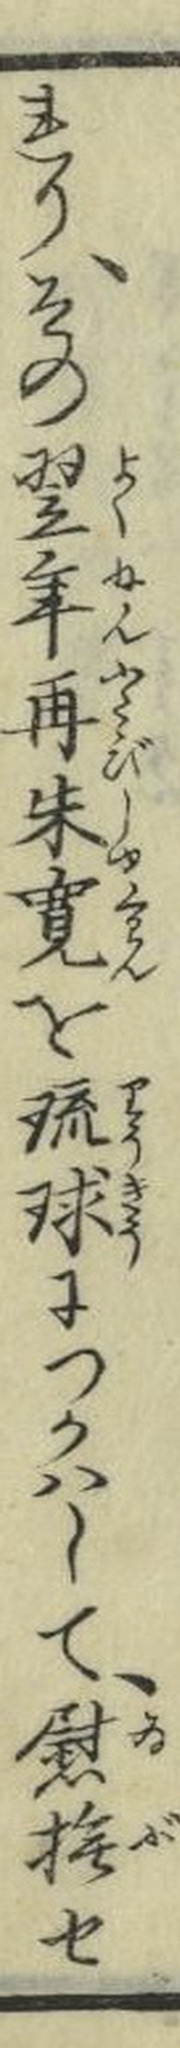れり、その翌年再朱寛を琉球につかはして、慰撫せ
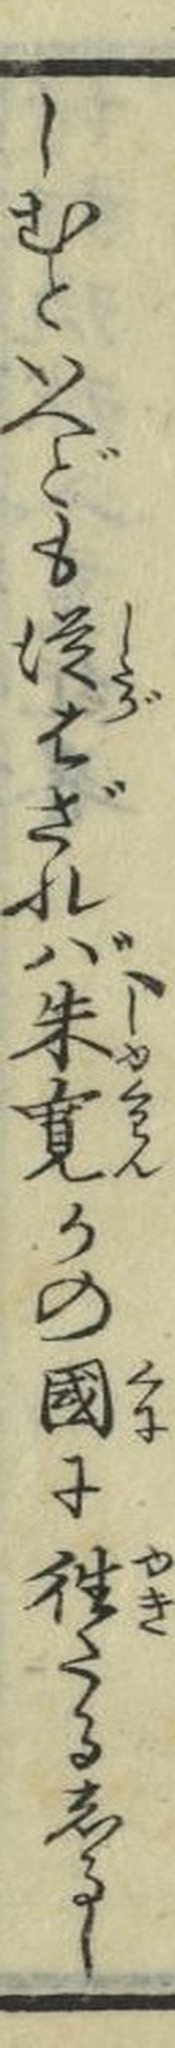しむといへども従はざれば、朱寛かの国に往たるしるし
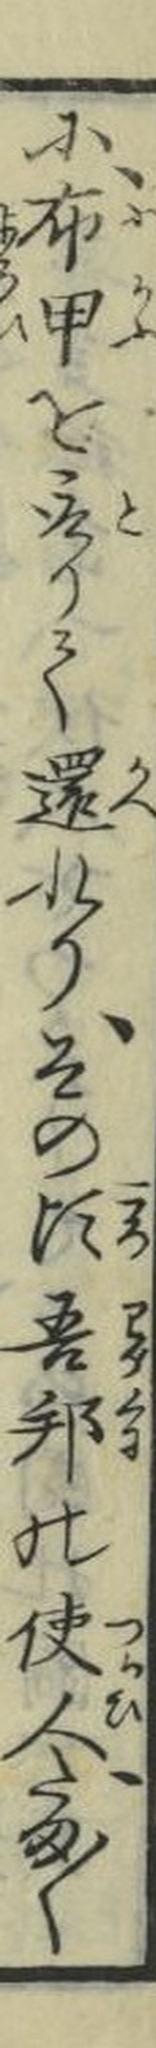に、布甲を取りて還れり、その頃吾邦の使人、たま〳〵
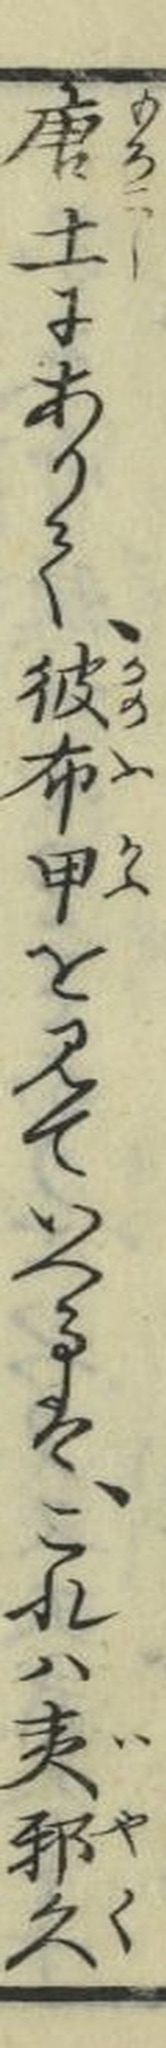唐土にありて、彼布甲を見ていへるは、これは夷邪久
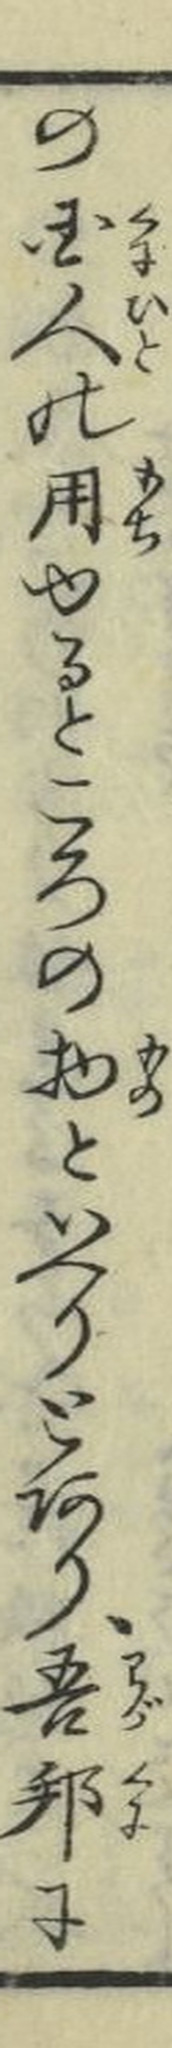の国人の用ゆるところの物といへりとあり、吾邦に
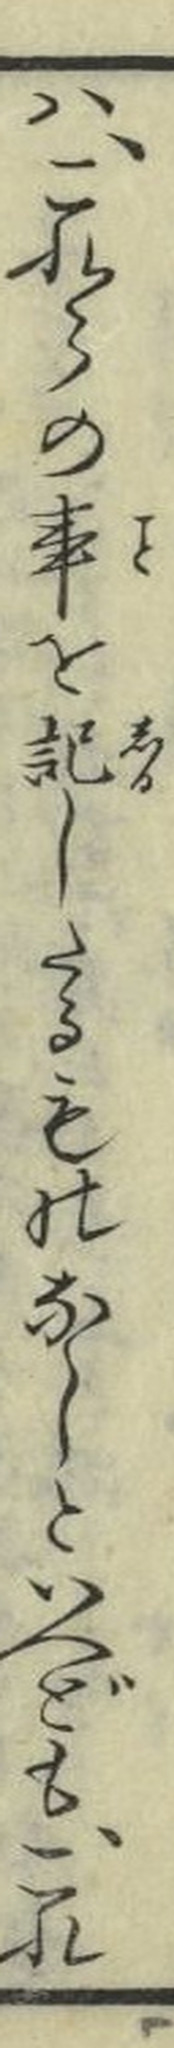は、これらの事を記したるものなしといへども、これ
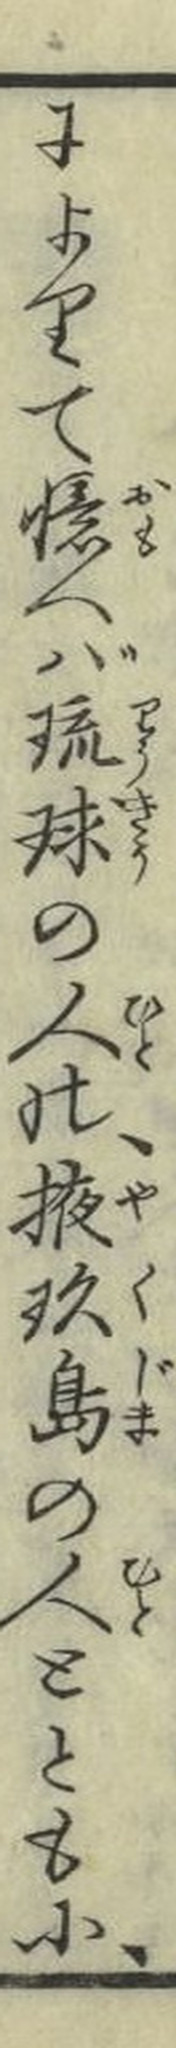によりて憶へば琉球の人の、掖玖島の人とともに、
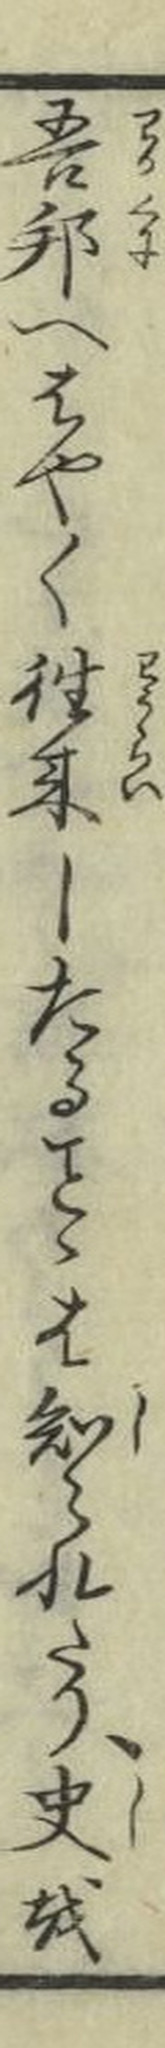吾邦へはやく往来したることゝは知られたり、史を
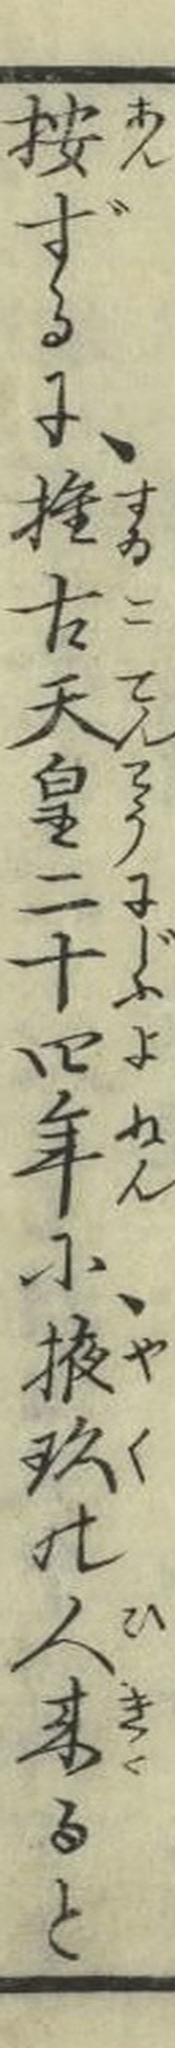按ずるに、推古天皇二十四年に掖玖の人来ると
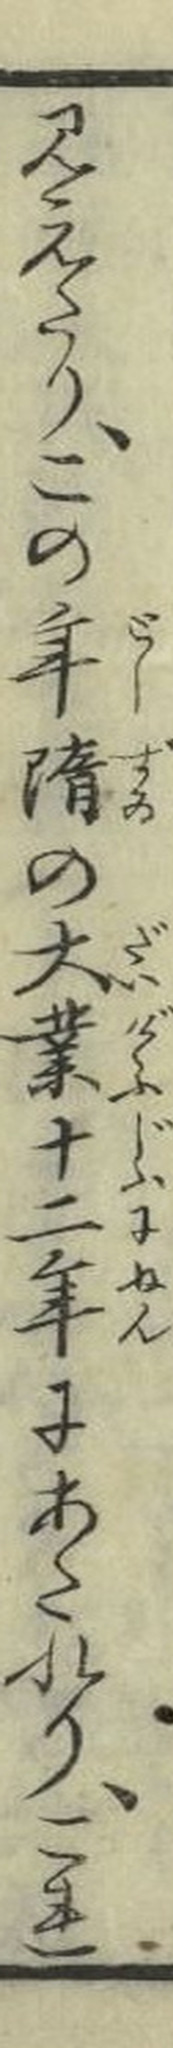見えたり、この年隋の大業十二年にあたれり、これ
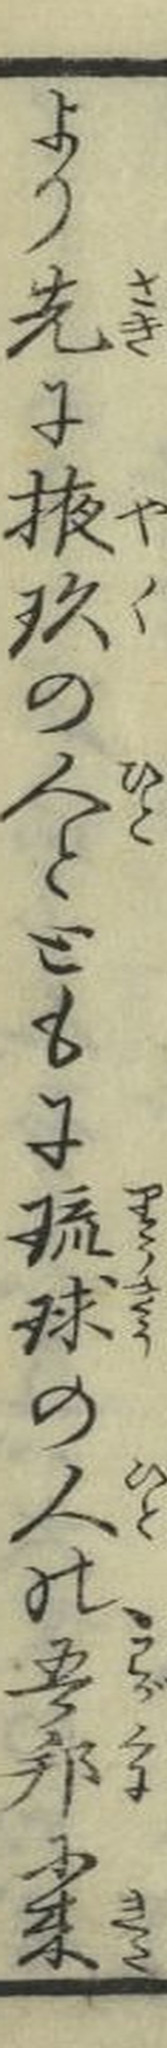より先に掖玖の人とともに琉球の人の、吾邦に来

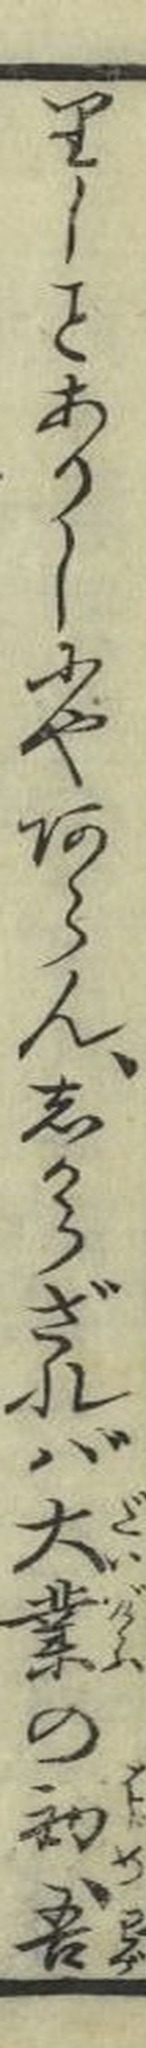りしことありしにやあらん、しからざれば大業の初、吾
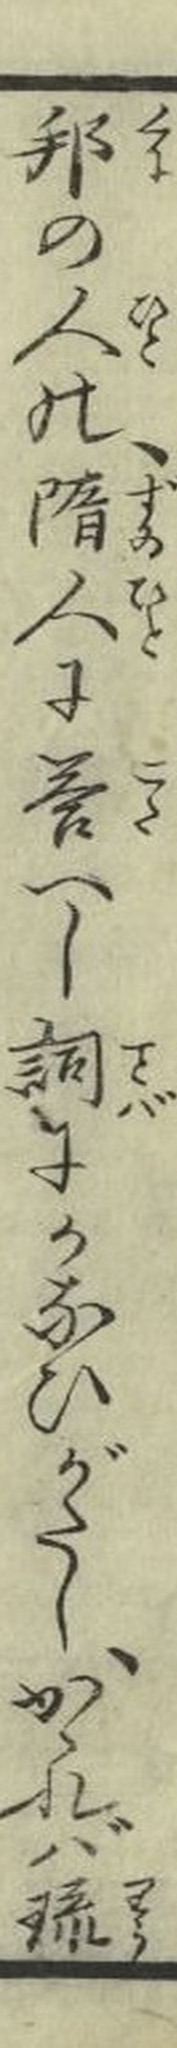邦の人の、隋人に答へし詞にかなひがたし、かゝれば琉
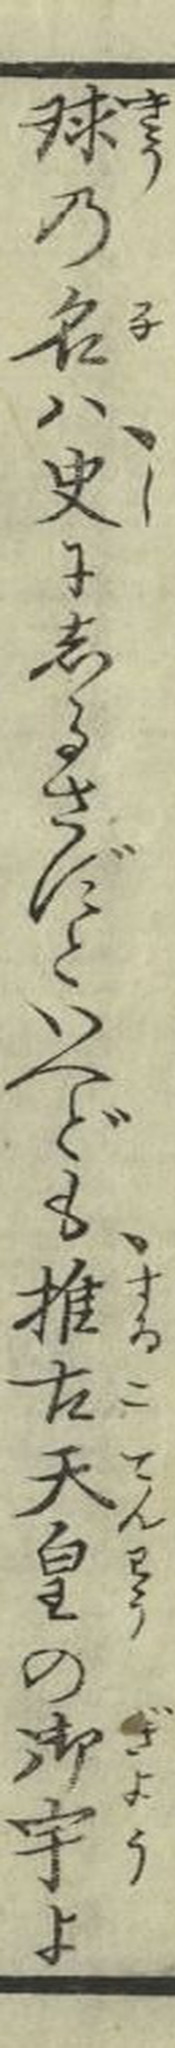球の名は、史にしるさずといへども、推古天皇の御宇よ
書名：琉球入貢紀略
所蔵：University of the Ryukyus Library
